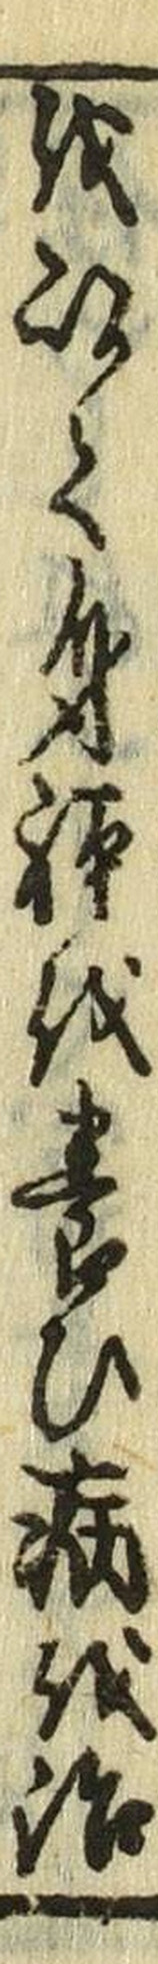を以て身体を養ひ病を治
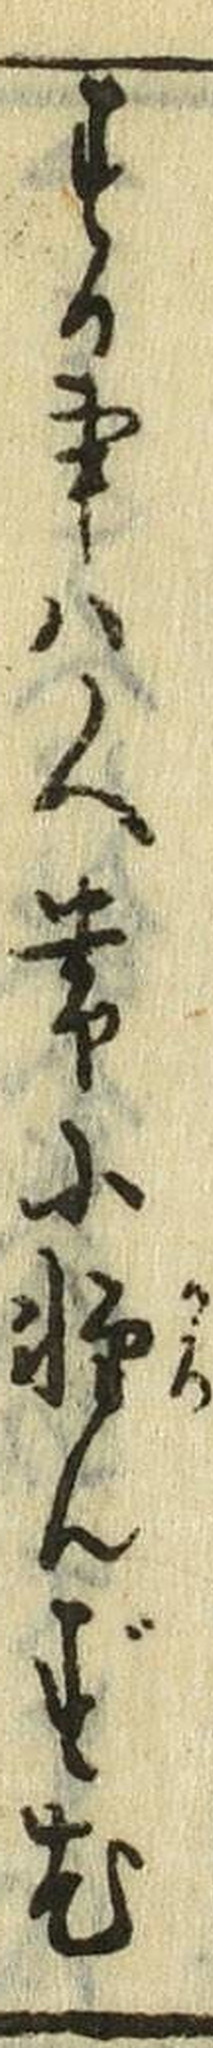する事は人常に軽んず尤
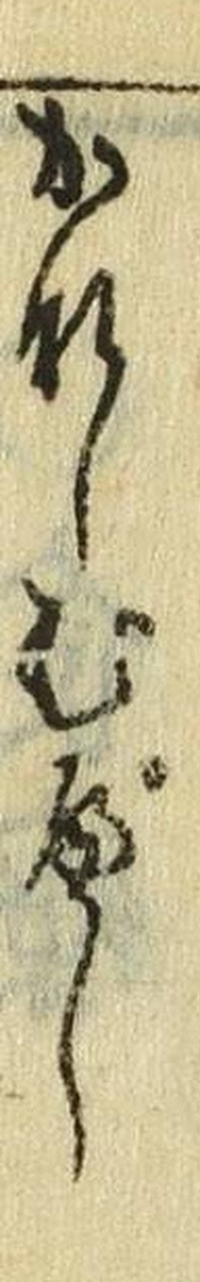かなしむべし
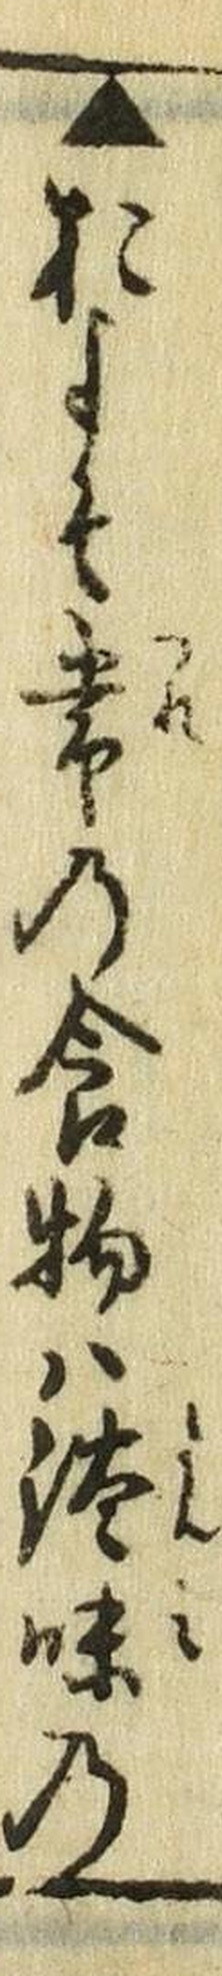▲およそ常の食物は淡味の
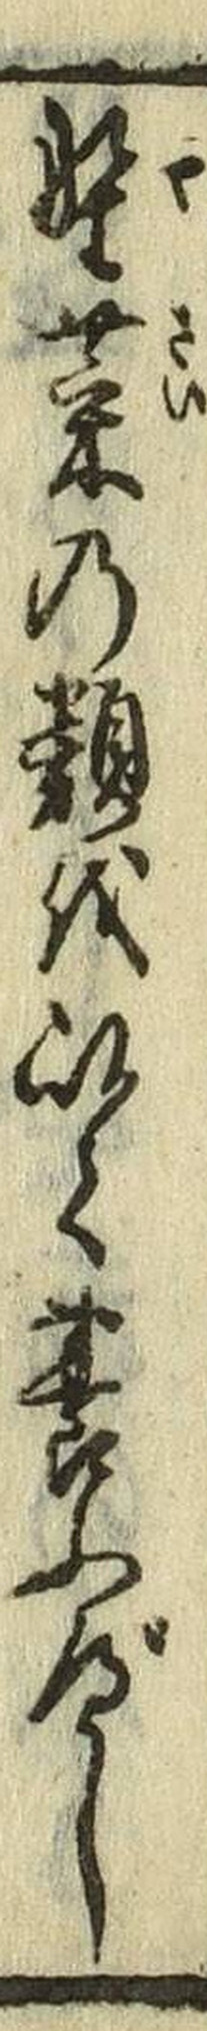野菜の類を以て養ふべし
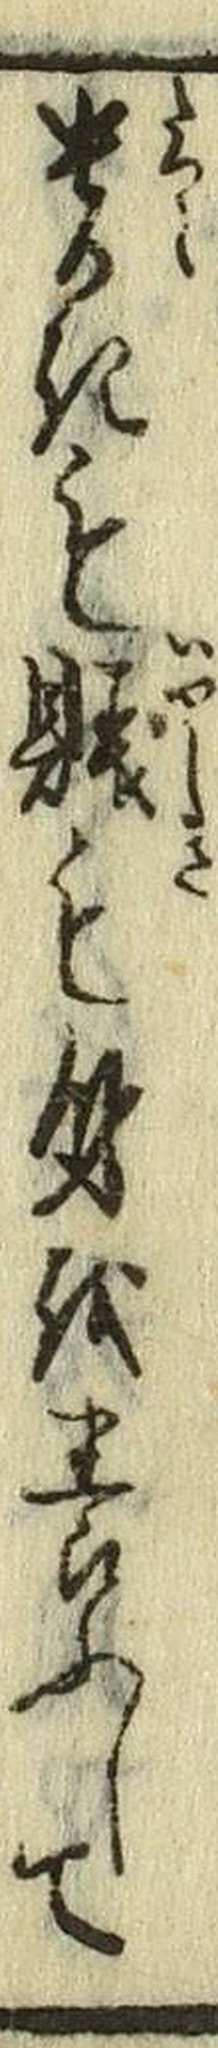貴きも賤も身を養ふして
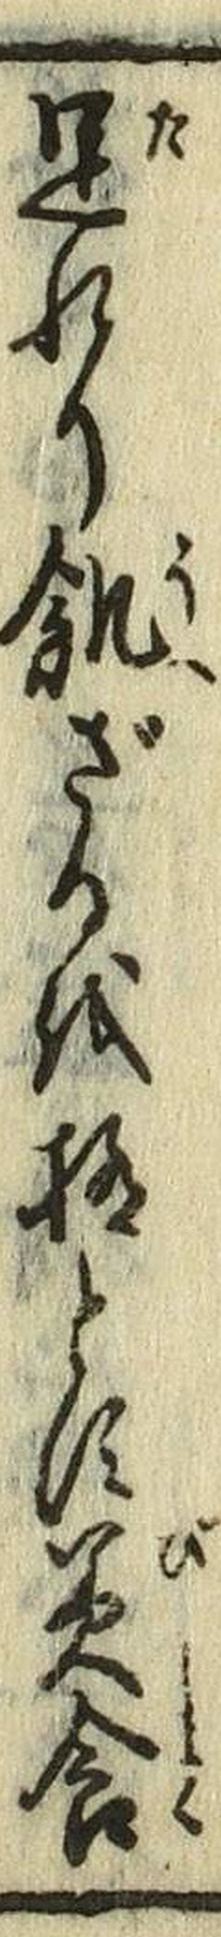足れり飢ざるを極とす美食
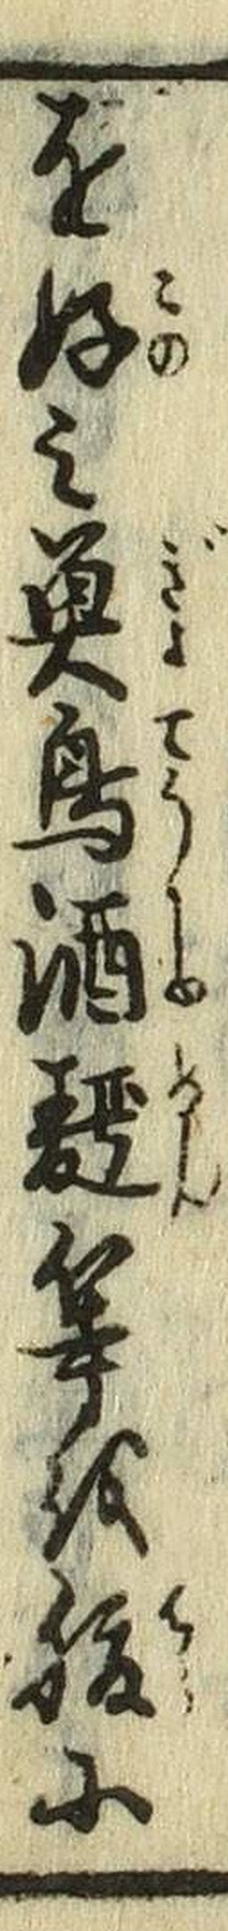を好み魚鳥酒麪等を腹に
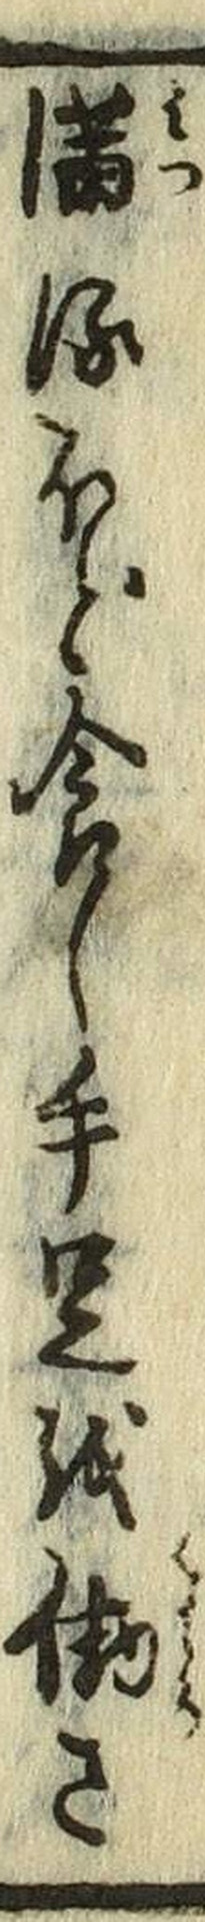満るほど食し手足を働さ
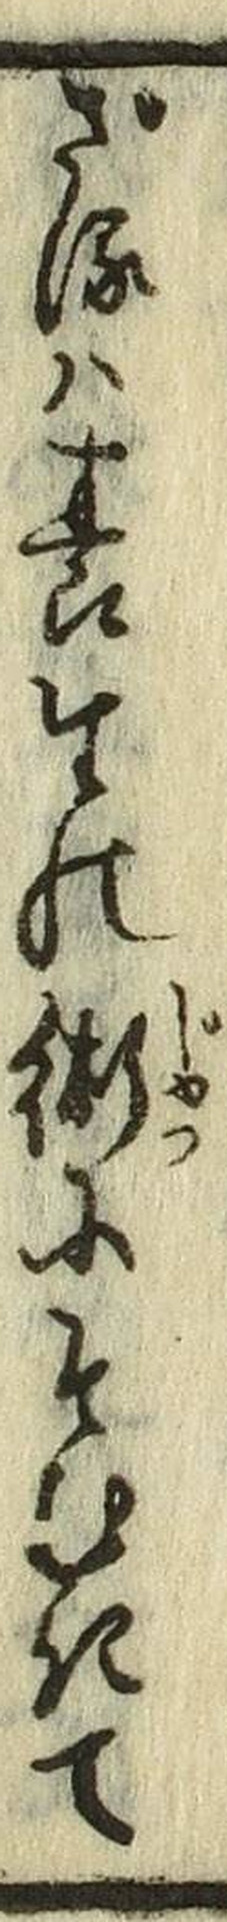ざるは養生の術にそむきて
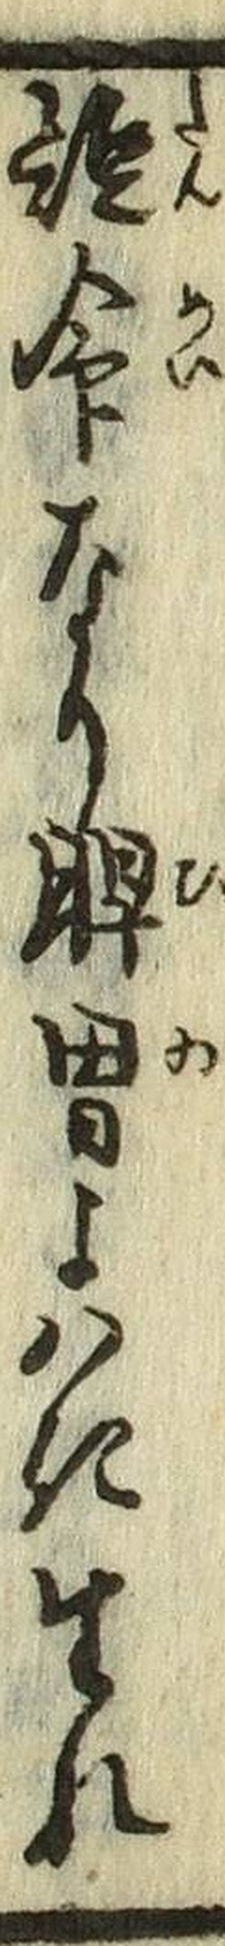短命なり脾胃よはき生れ
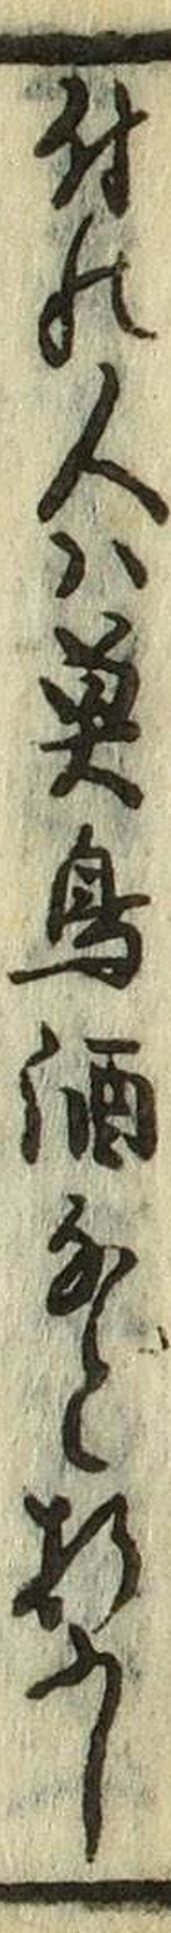付の人は魚鳥酒など折ふし
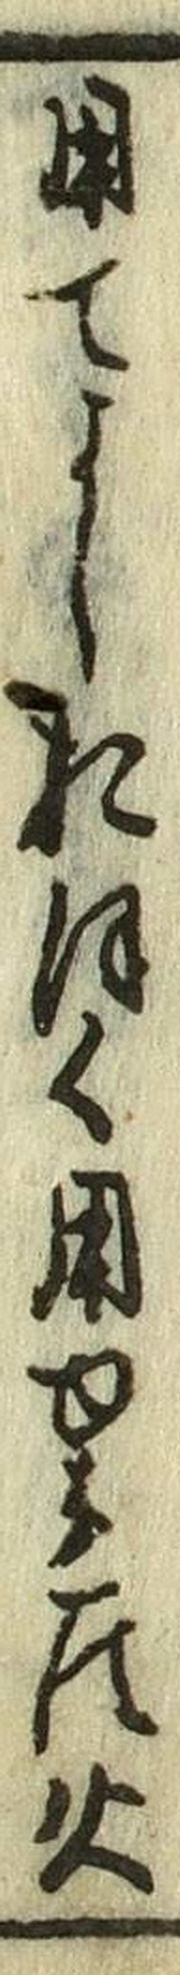用てよしおほく用ゆれは火
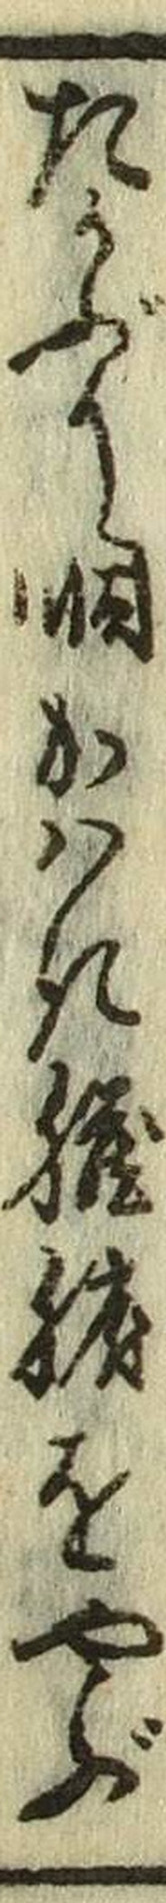たかぶり咽かはき臓腑をやぶ
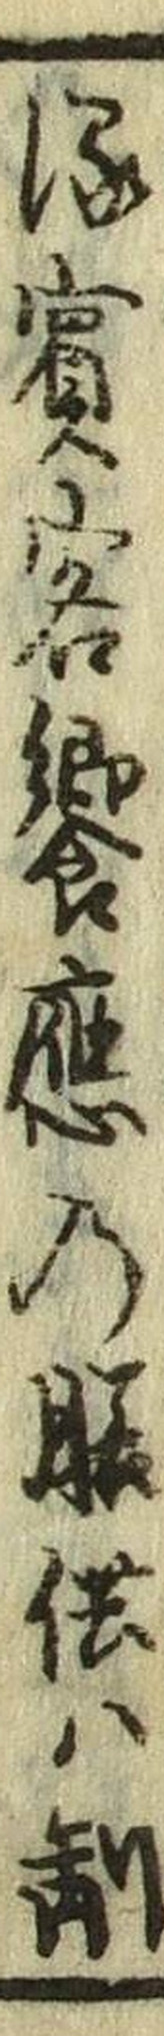る賓客饗応の膳供は制

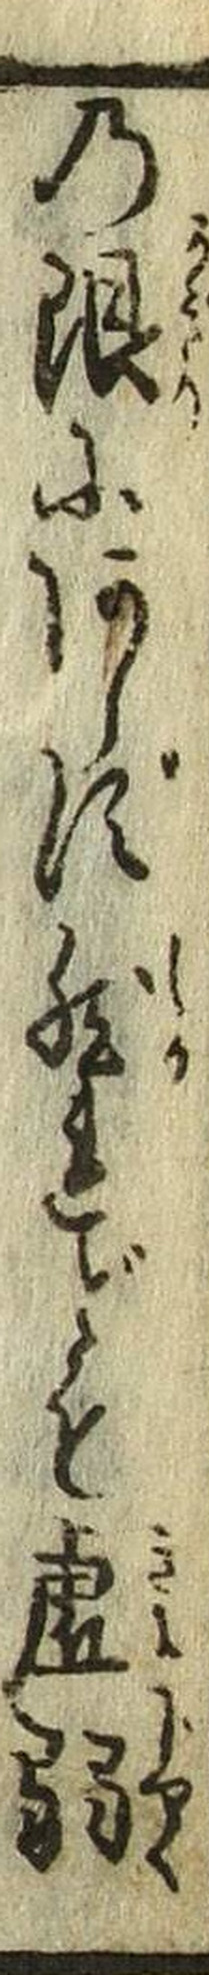の限にあらず然れども虚弱
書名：居家養生記
